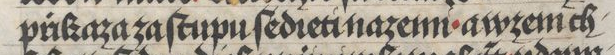pṙikáza zaſtupu ſedieti nazemí.a wzem ch¬
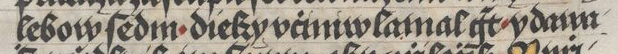lebow ſedm.dieky vċiniw lamal ḡt.y dawa¬
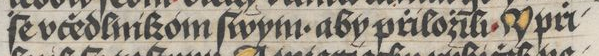ẛe včedlníkóm ſwym.aby pṙilożili.Y pṙi¬
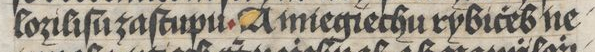loziliſu zaſtupu.A miegíechu rybiċeb ne¬
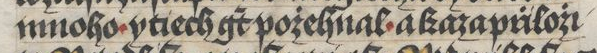mnoho.ytiech ḡt pożehnal.a kaza pṙilożi¬
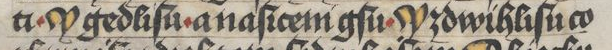ti.Y gedliſu.a naſiceni gſu.Y zdwihli ſu co
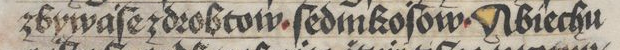zbywaẛe z drobtow. ſedm koẛow. A bíechu
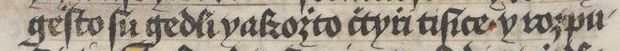geẛto ſu gedli yakożto ċtyṙi tiſice.y rozpu¬
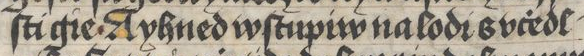ſti gie.A yhned wſtupiw naloḋí s vċedl¬
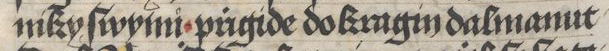níky ſwymi.pṙigide do kragin dalmanut¬
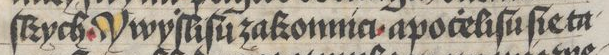ſkych.Y wyẛli ſu zakonníci.a poċeli ſu ſie ta¬
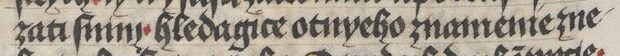zati ſnimi.hledagice ot nyeho znameníe zne¬
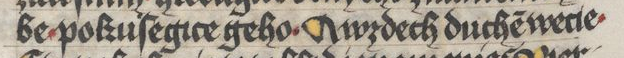be.pokuẛegice geho.A wzdech duchē wecie.
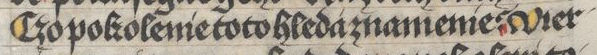Czo pokoleníe toto hledá znameníe? Vier¬
